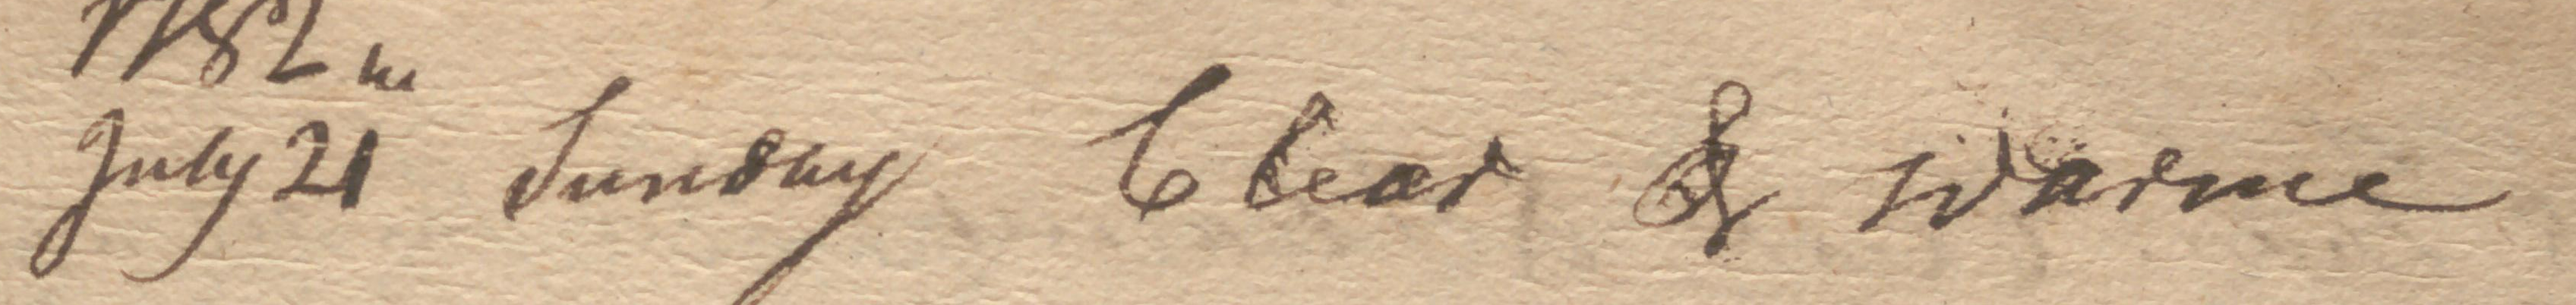July 21^th Sunday Clear & Warme
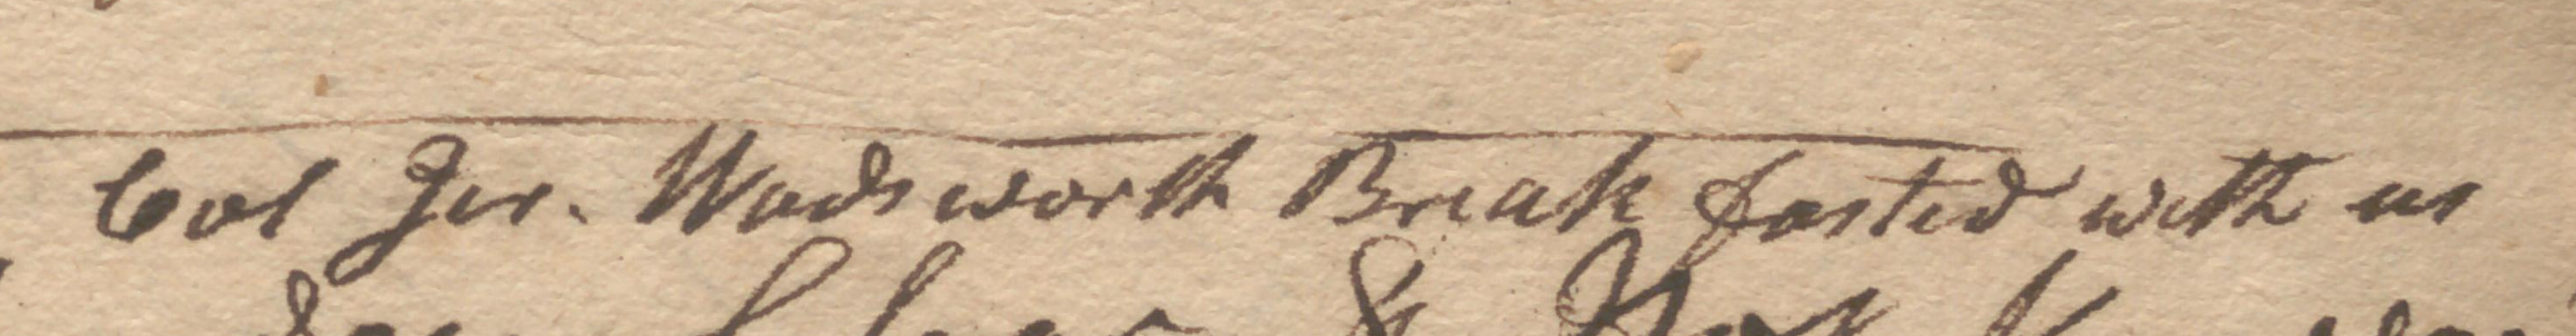Col Jer. Wadsworth Breakfasted with us
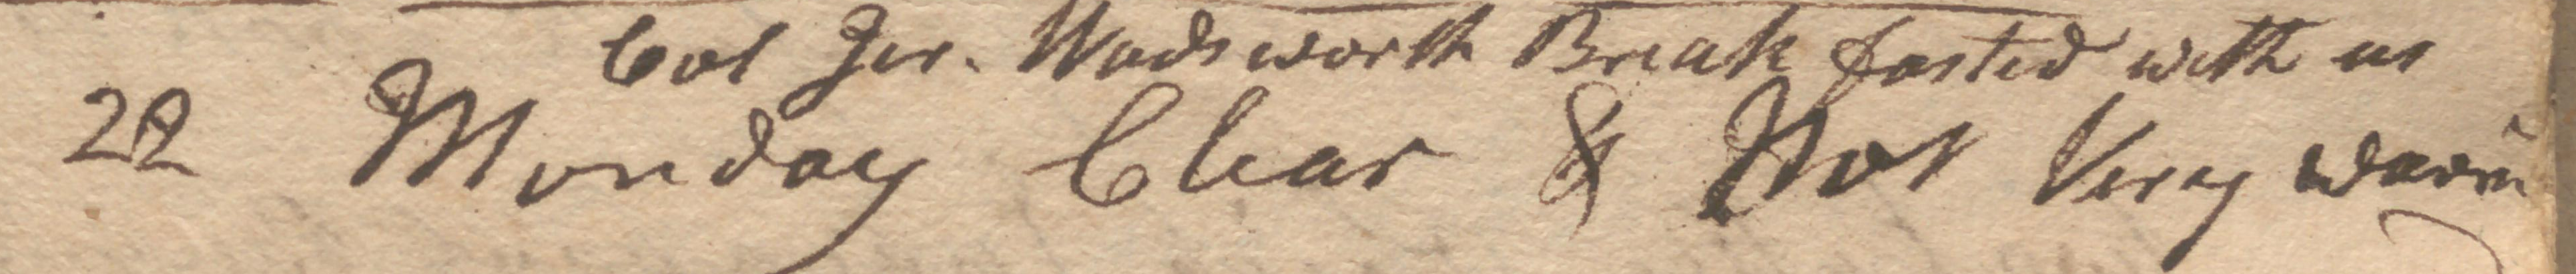22 Monday Clear & Not Very warm
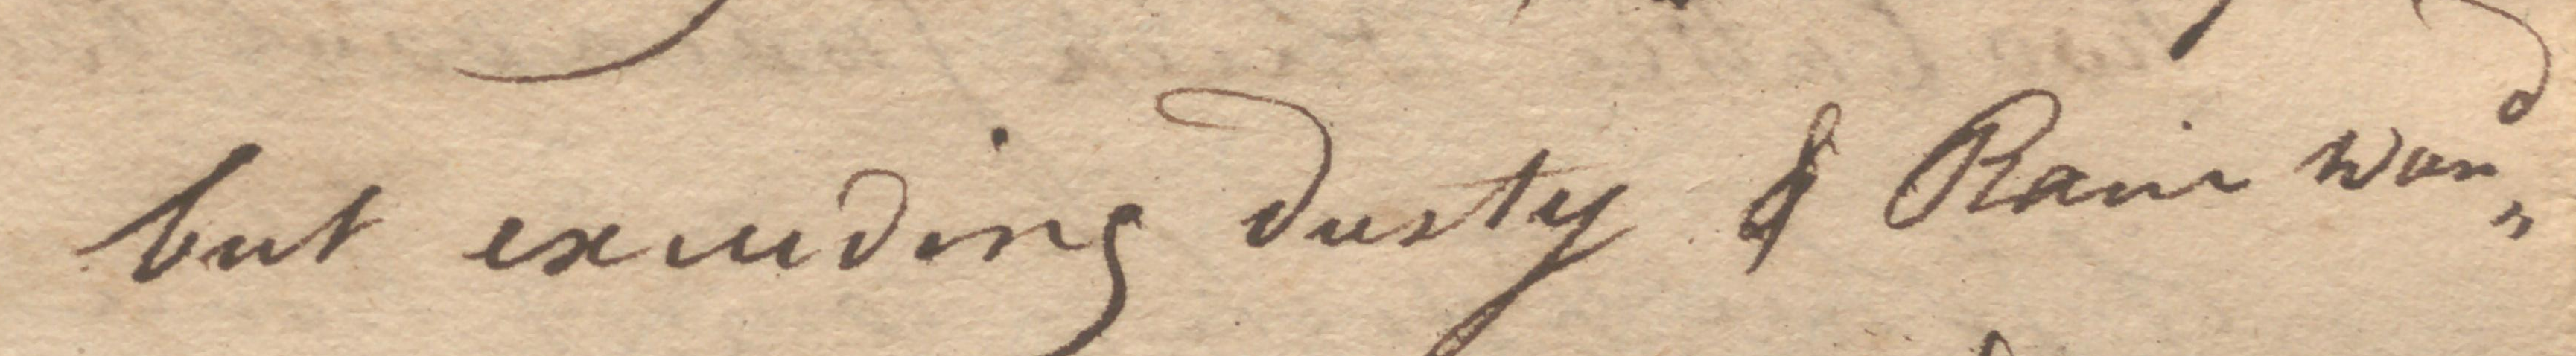but exceeding dusty, & Rain wan^d
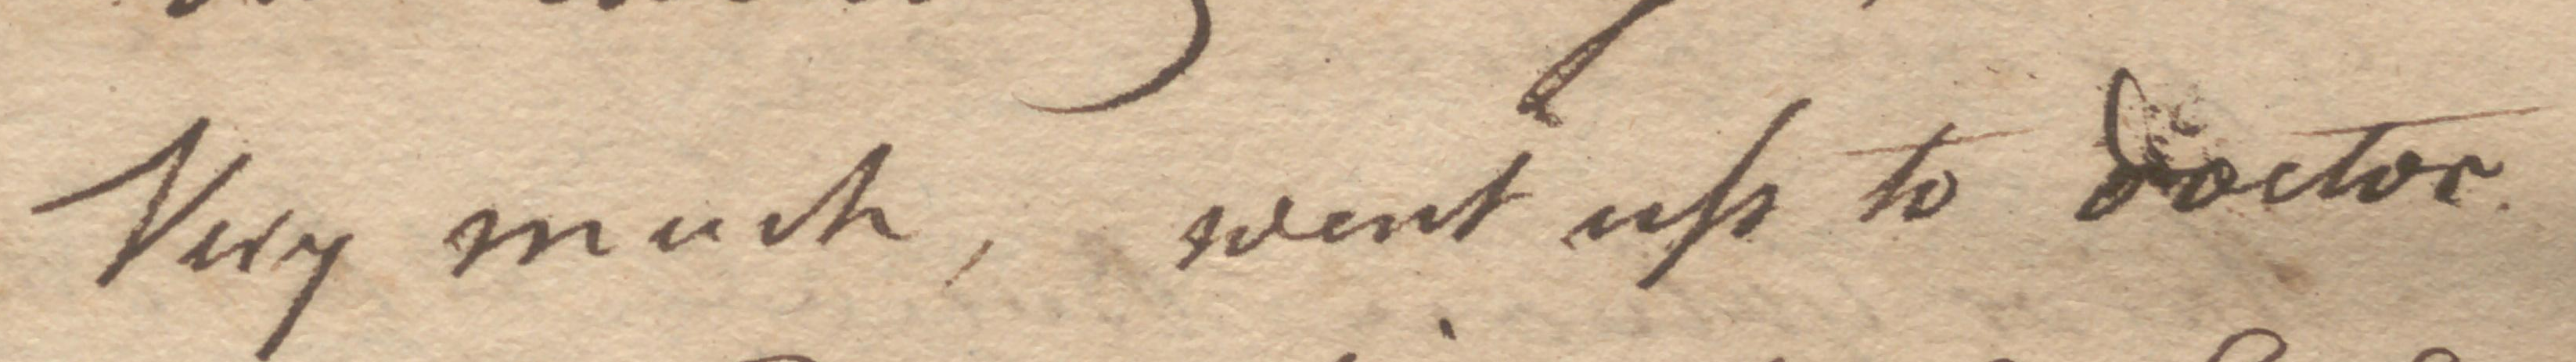Very much, went up to doctor
